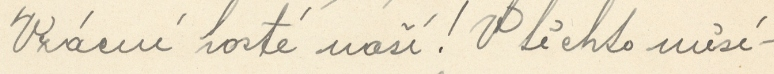Vzácní hosté naší! V těchto měsí-
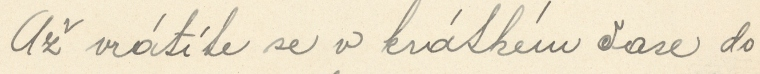Až vrátíte se v krátkém čase do
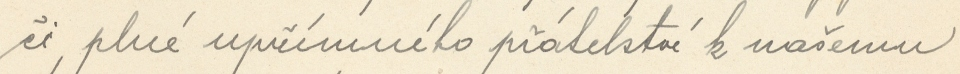či, plné upřímného přátelství k našemu
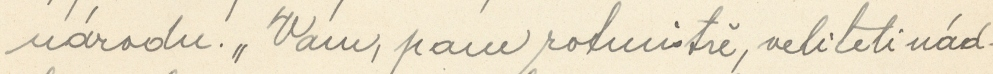národu. „Vám, pane rotmistře, veliteli nád-
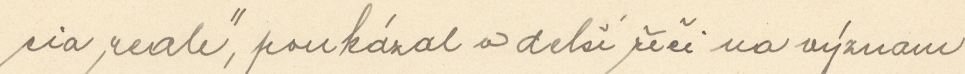cia reale“, poukázal v delší řeči na význam
